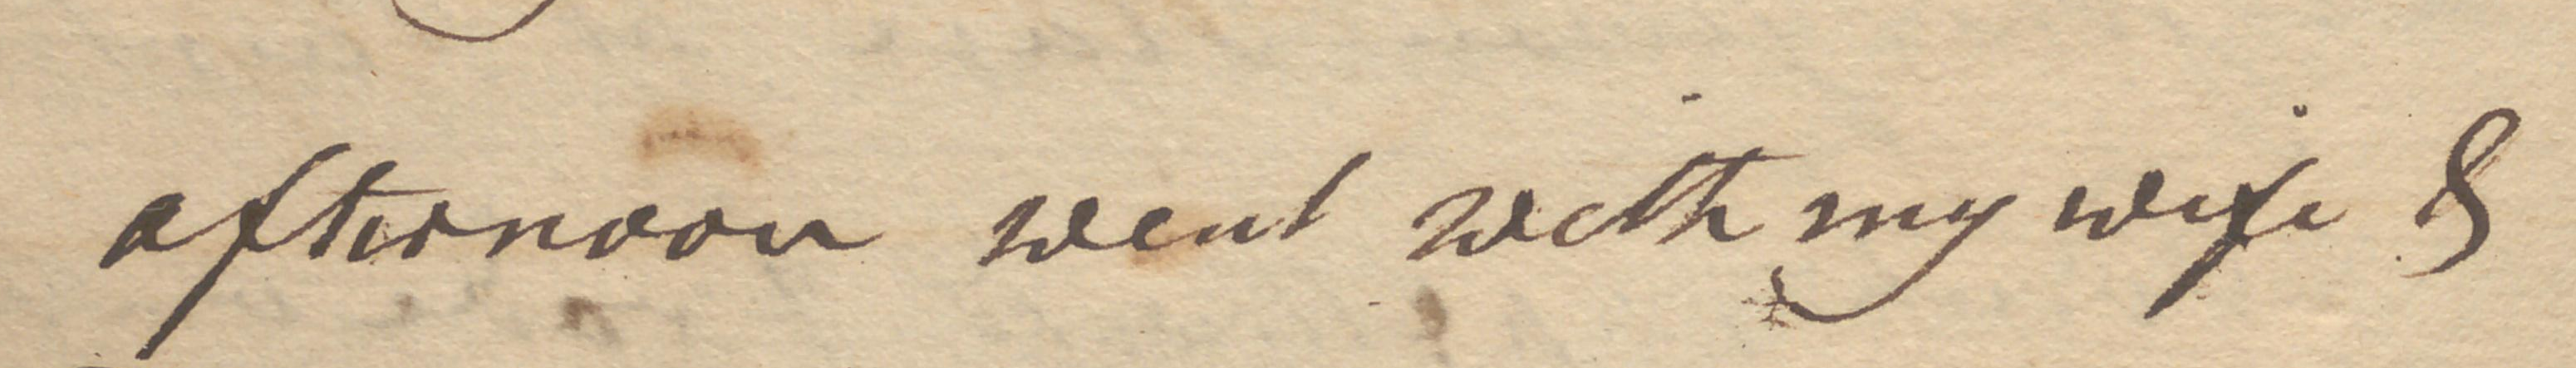afternoon went with my wife &
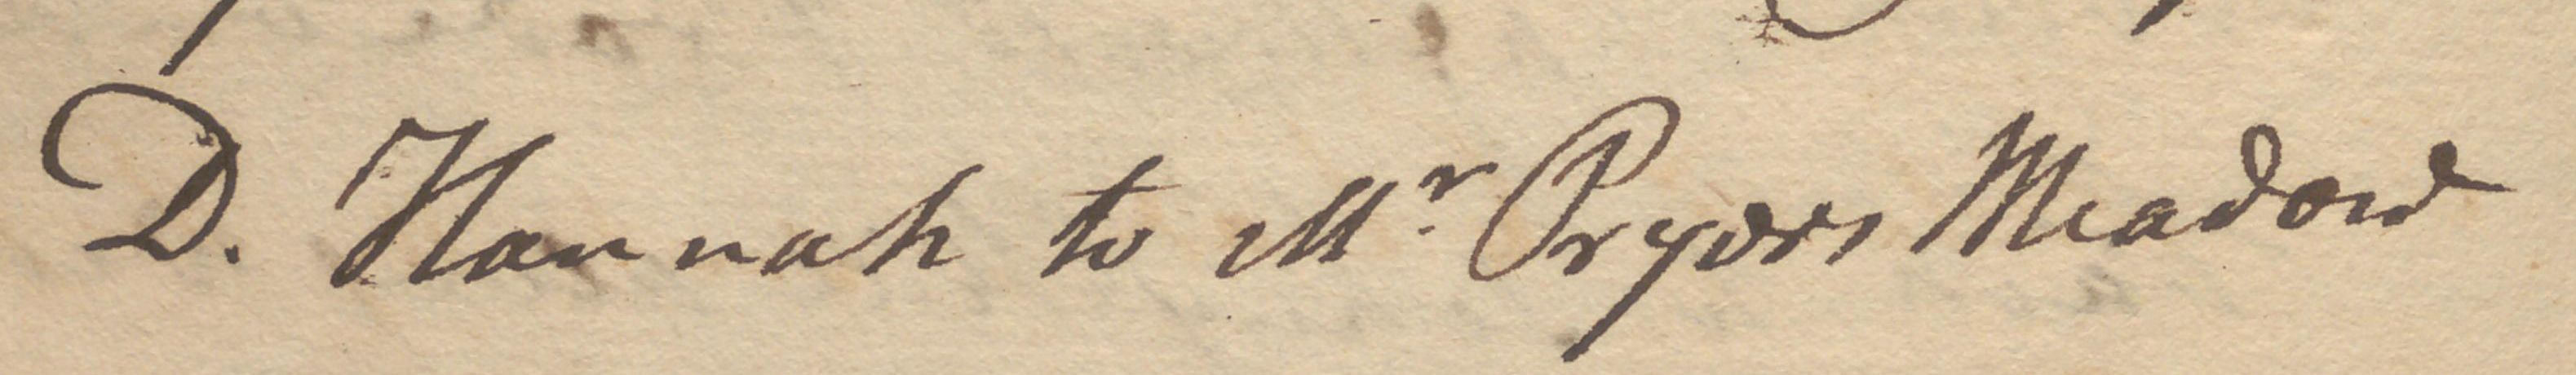D. Hannah to M^r. Pryors Meadow
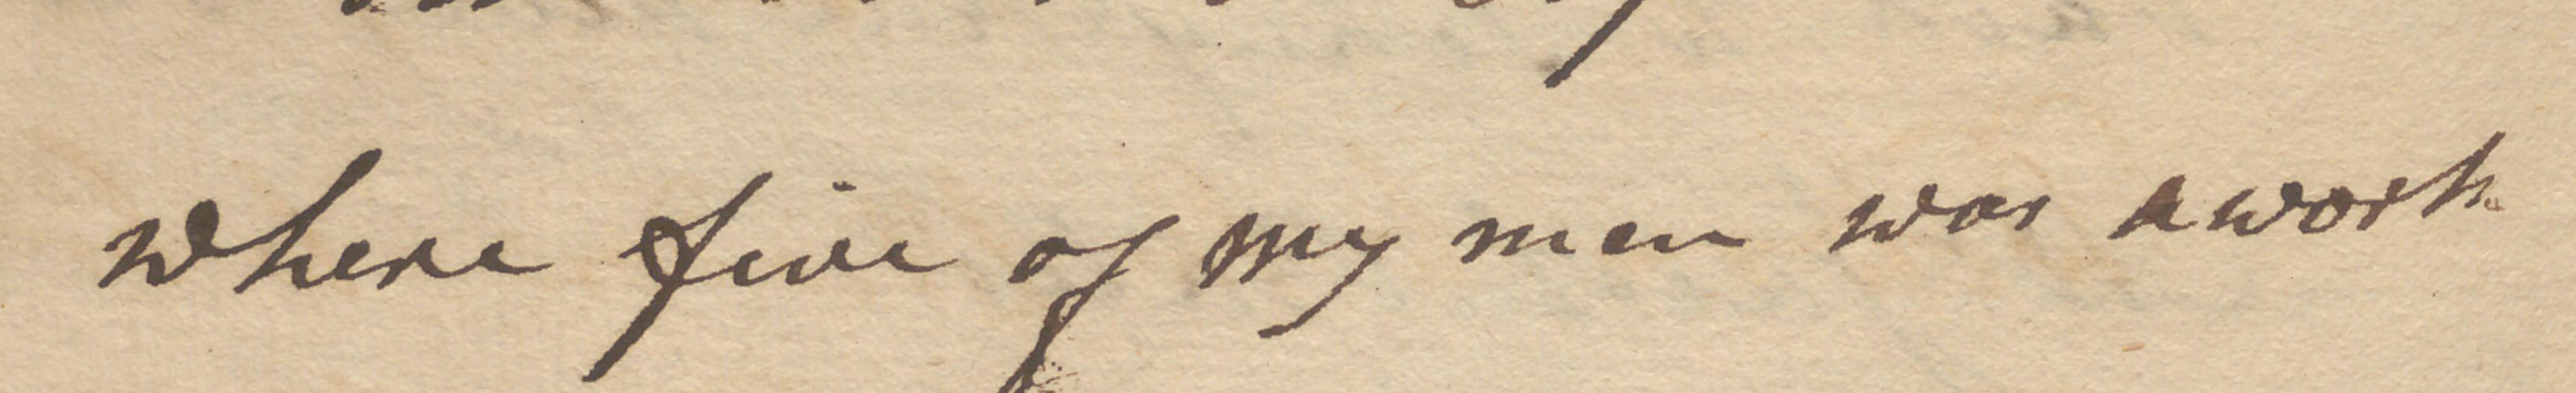where five of my men was a work
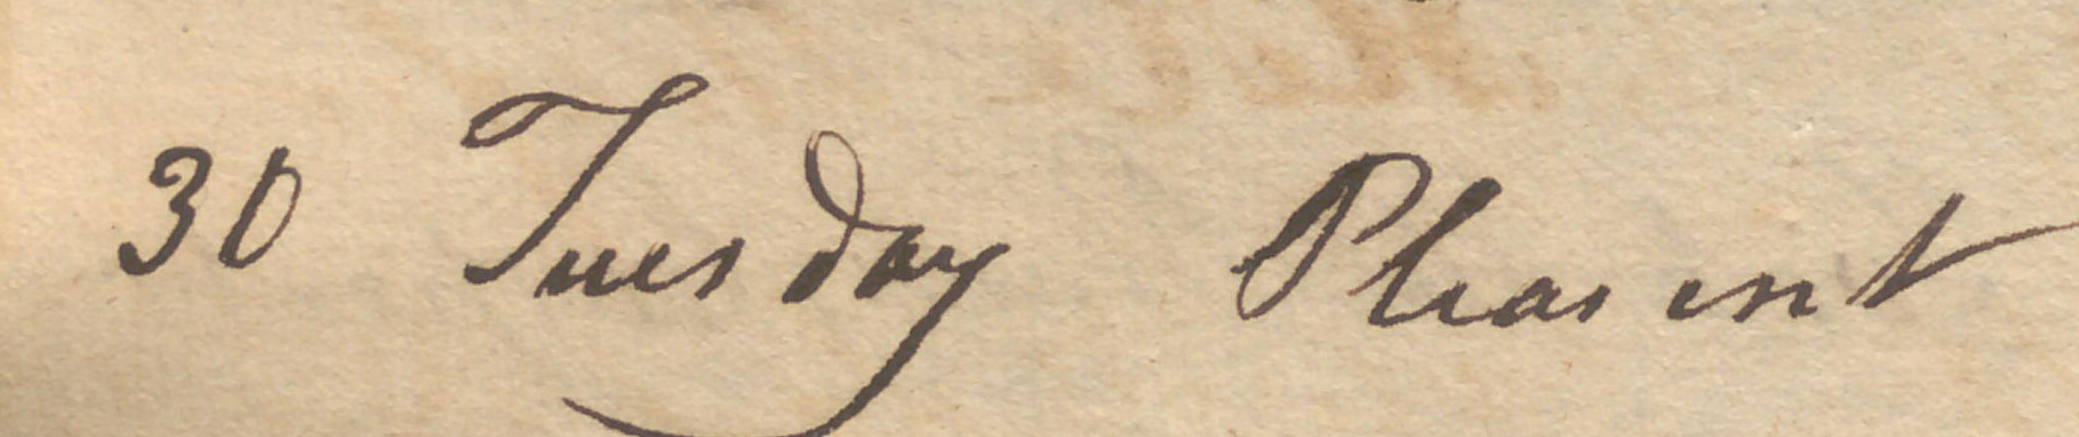30 Tuesday Pleasent
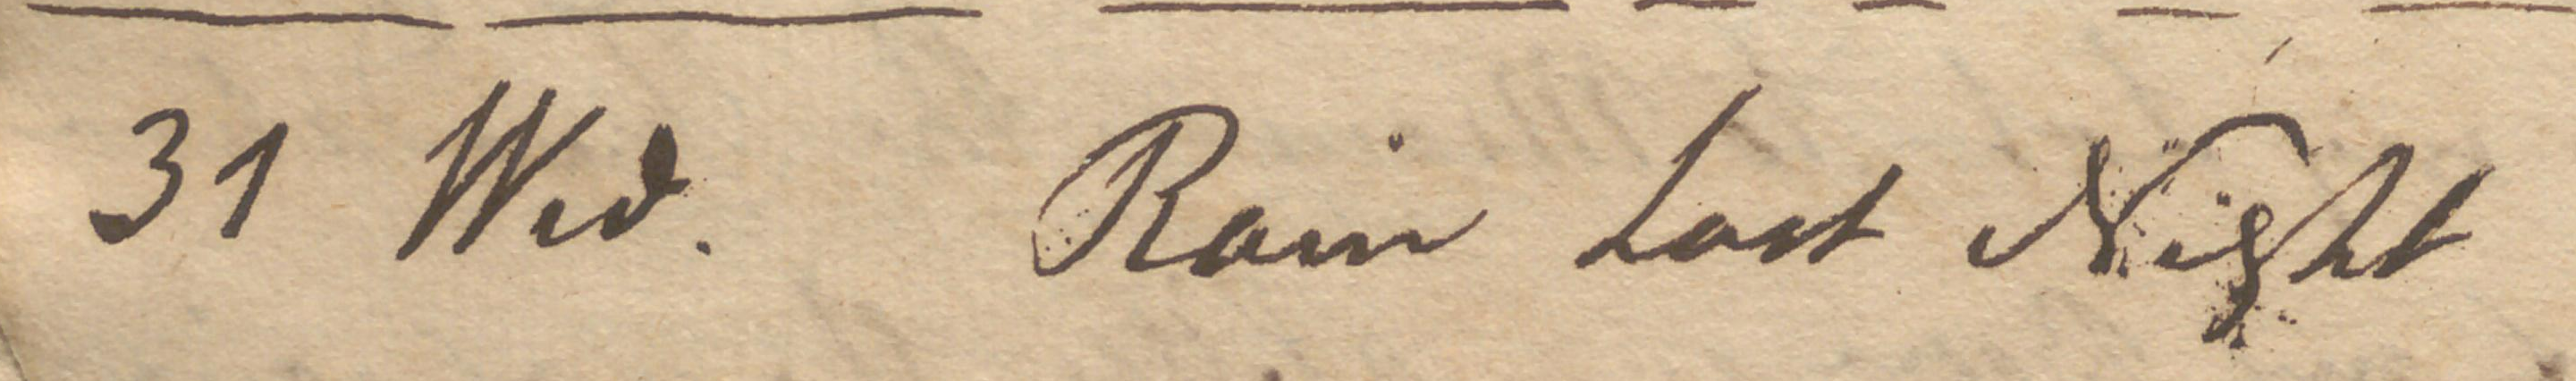31 Wed. Rain Last Night
